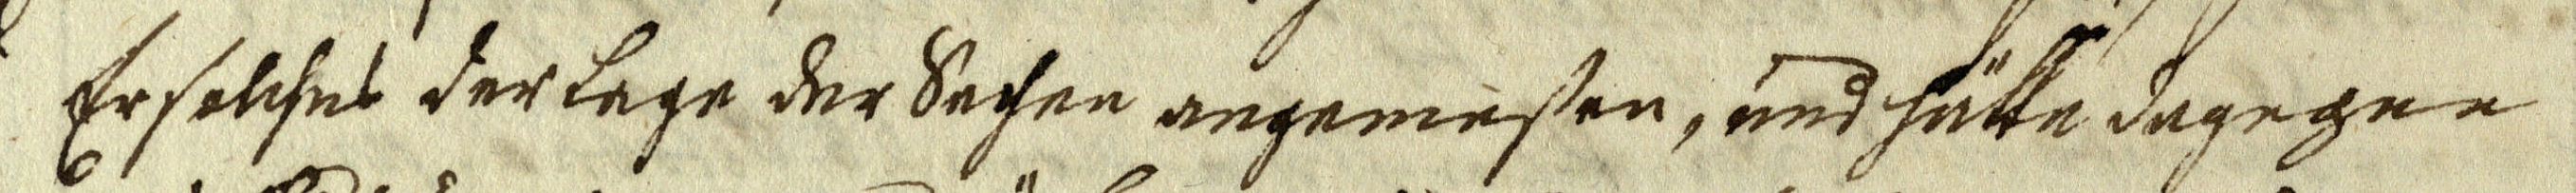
Er solches der Lage der Sachen angemesen, und hätte dagegen
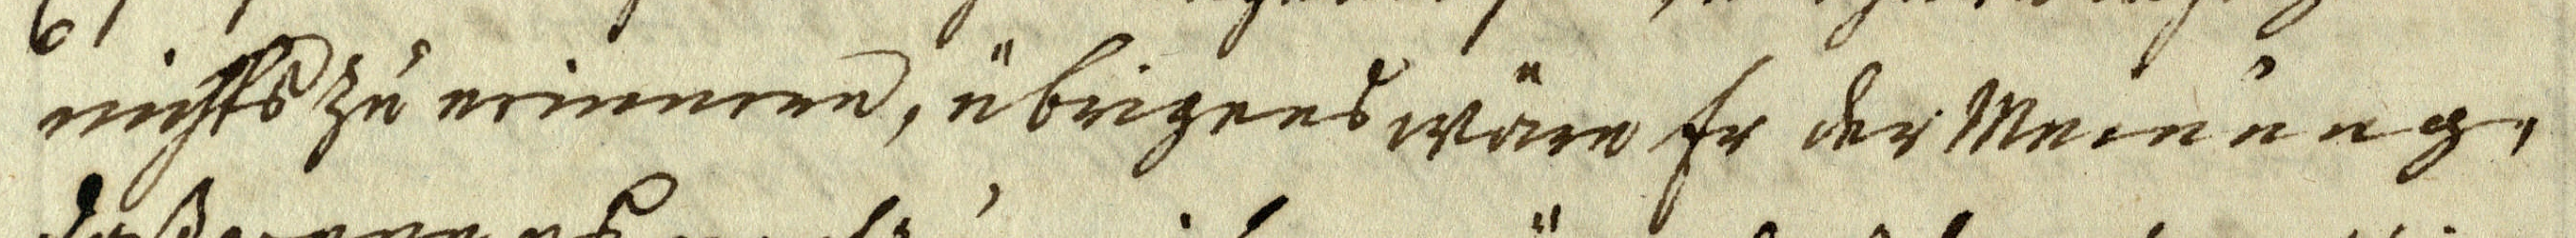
nichts zu erinnern, übrigens wäre Er der Meinung,
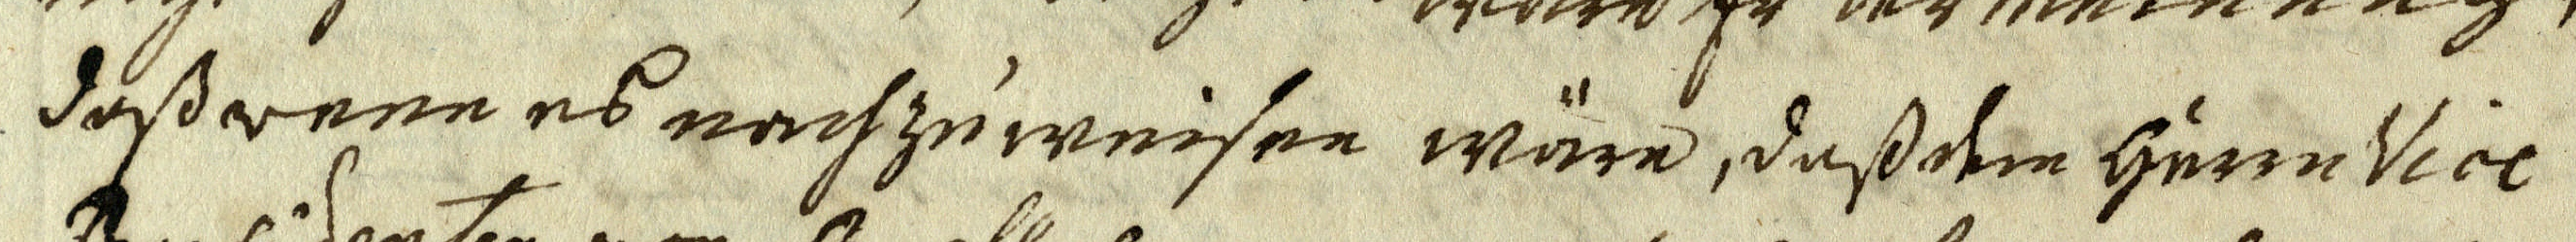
daß wenn es nachzuweisen wäre, daß dem Herrn Vice
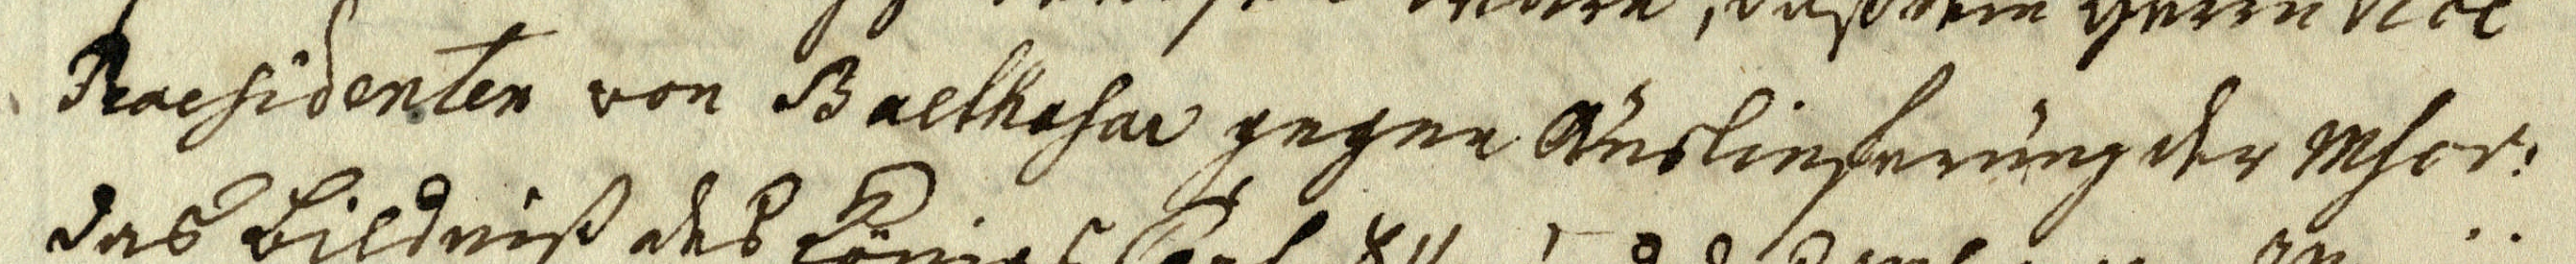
Praesidenten von Balthasar gegen Auslieferung der Mscr.
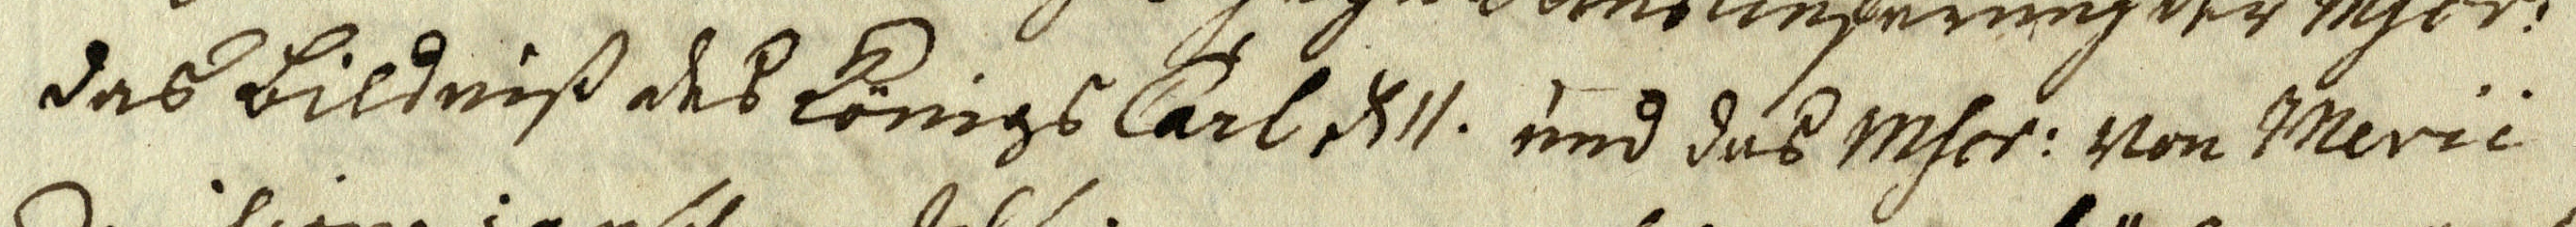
das Bildniß des Königs Carl XII. und das Mscr. von Mevii
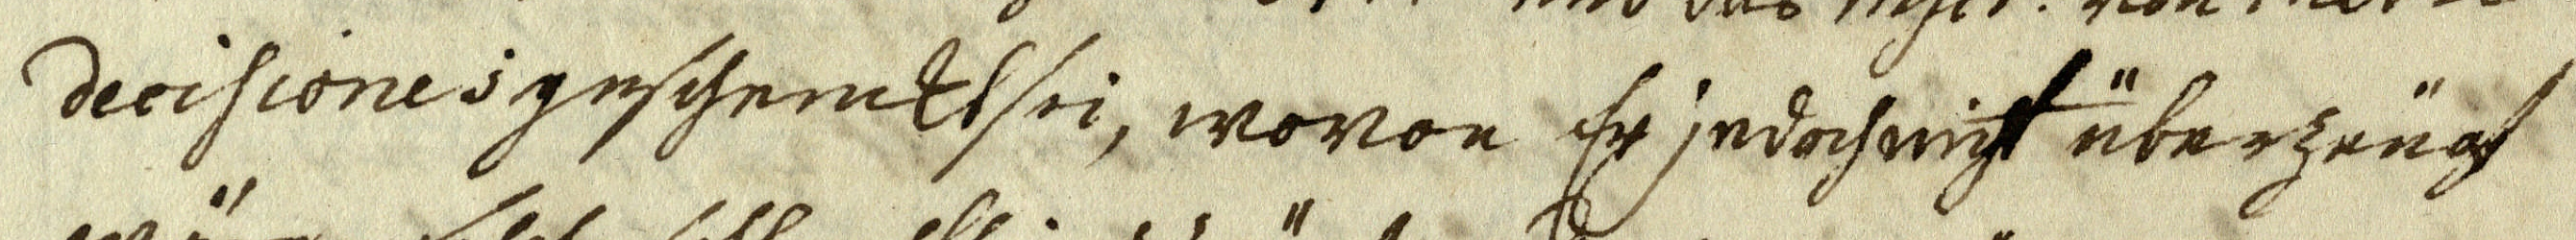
decisiones geschenckt sei, wovon Er jedoch nicht überzeugt
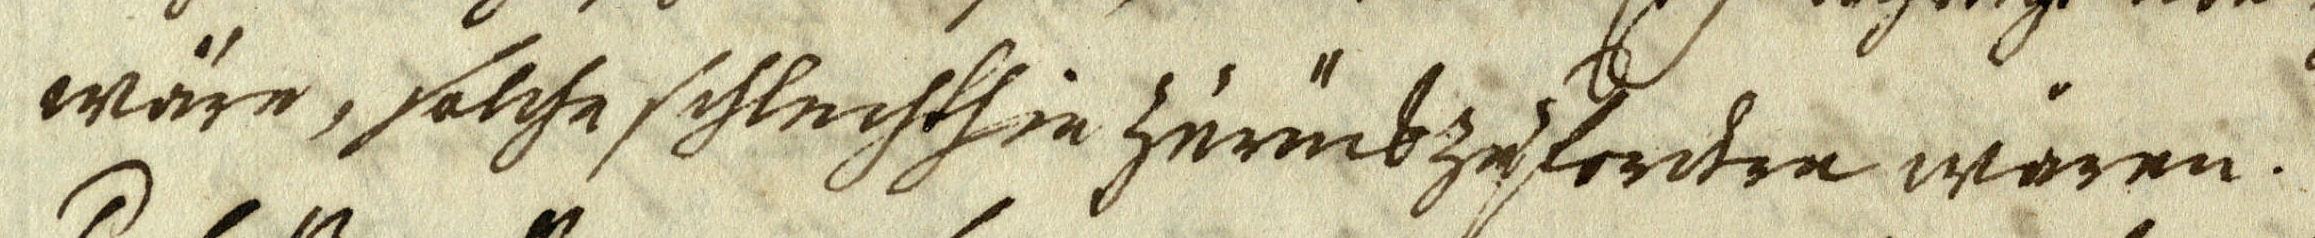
wäre, solche schlechthin zurückzufordern wären.
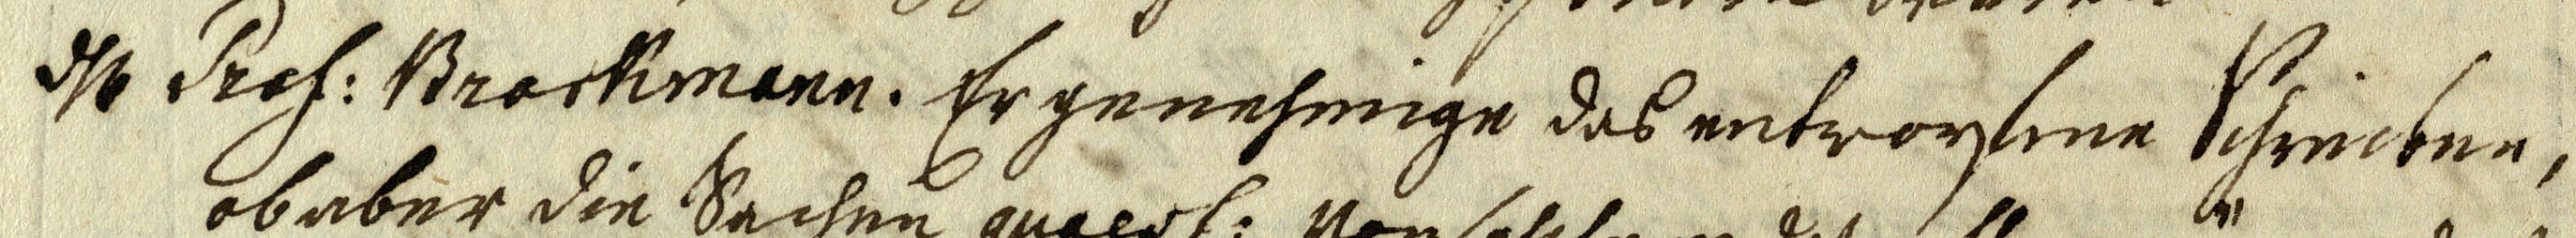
dh Prof. Brockmann. Er genehmige das entworfene Schreiben,
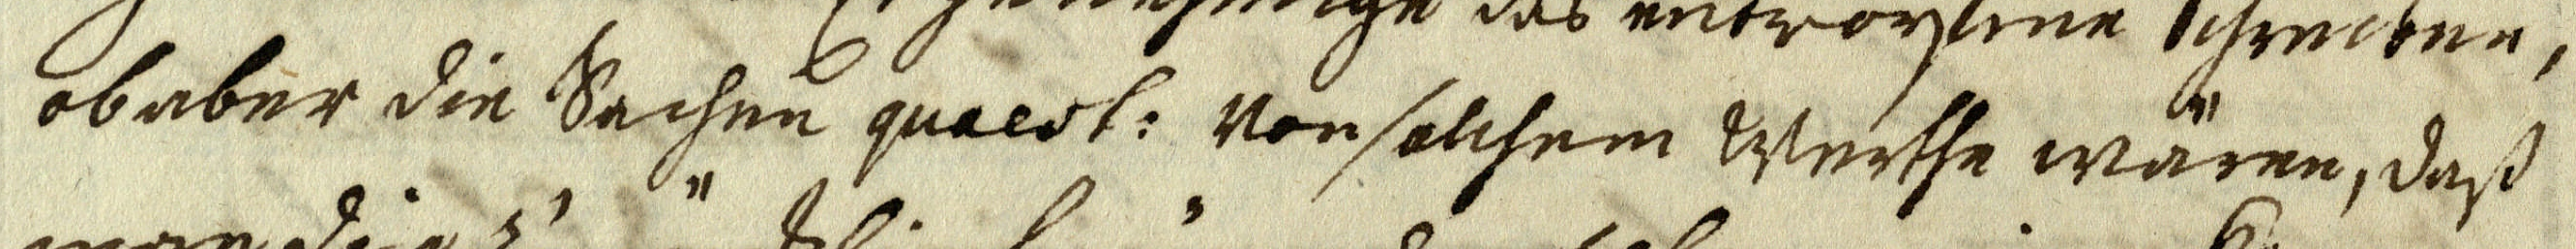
ob aber die Sachen quaest. von solchem Werthe wären, daß
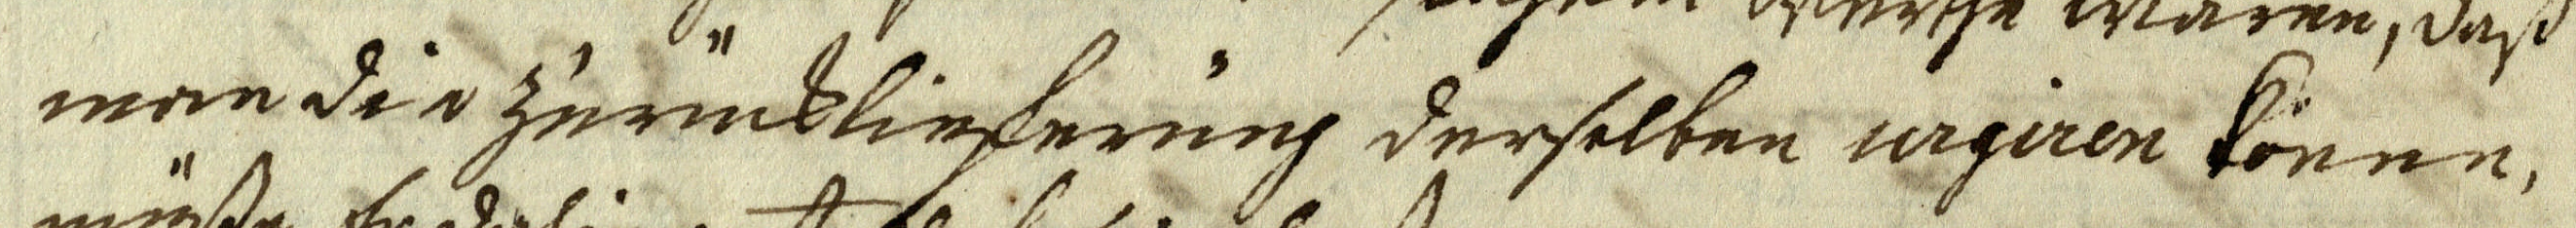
man die Zurücklieferung derselben urgiren könne,
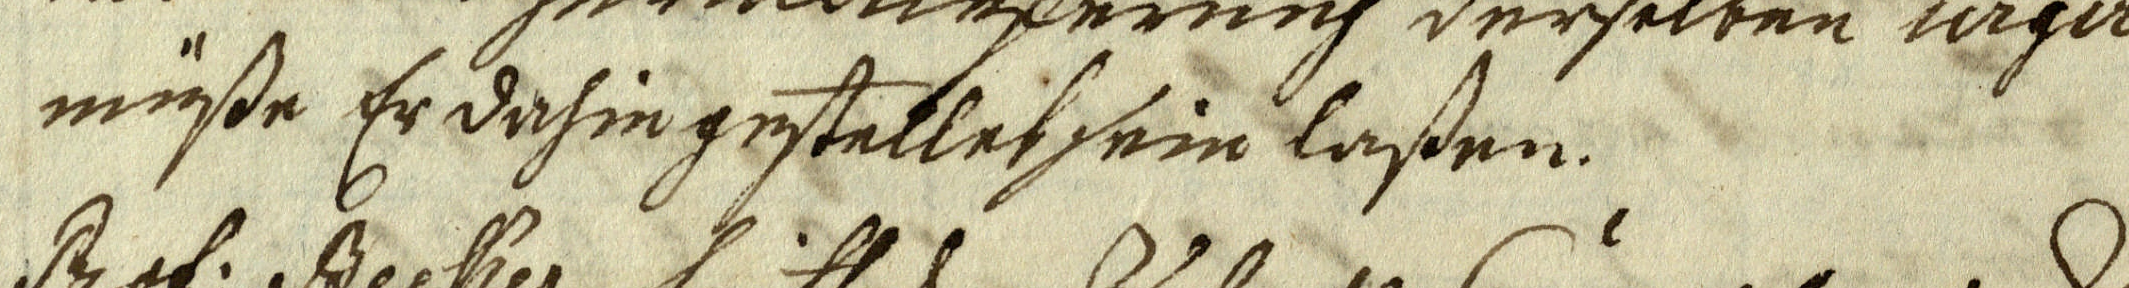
müße Er dahin gestellet sein laßen.
